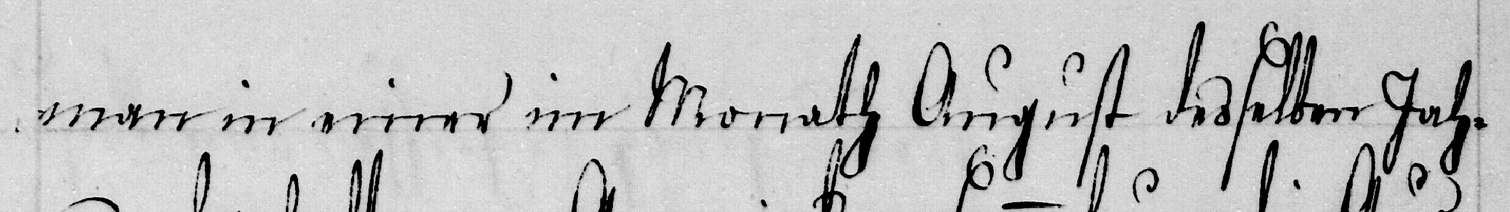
man in einer im Monath August desselben Jah¬
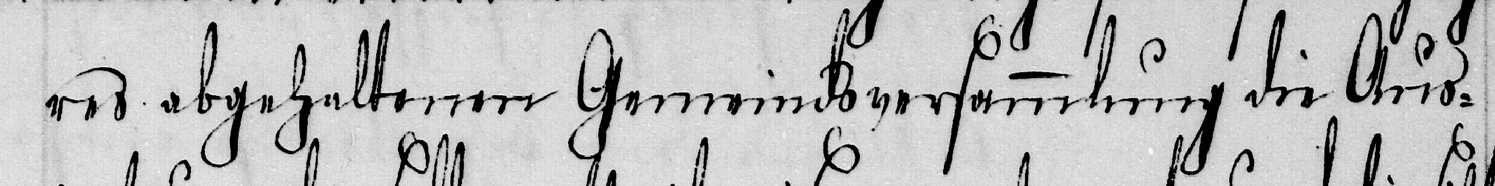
res abgehaltenen Gemeindsversammlung die Aus¬
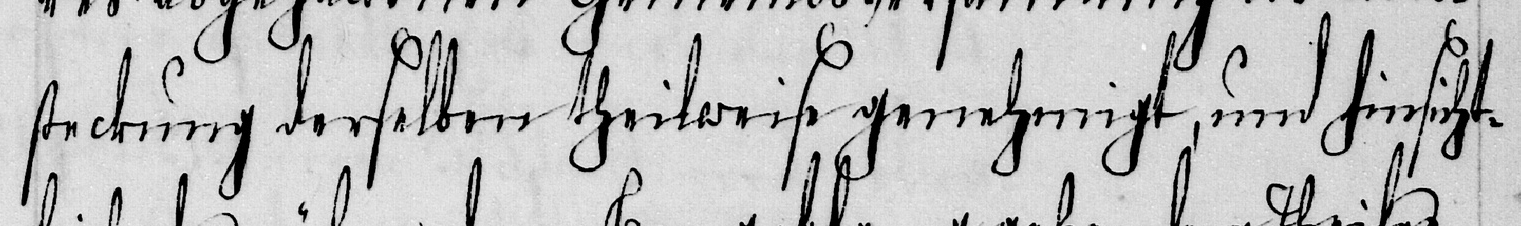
steckung derselben theilweise genehmigt, und hinsich¬
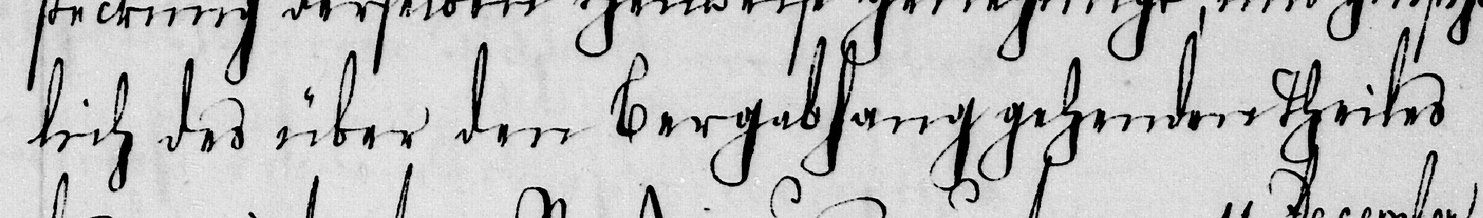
lich des über den Bergabhang gehenden Theils
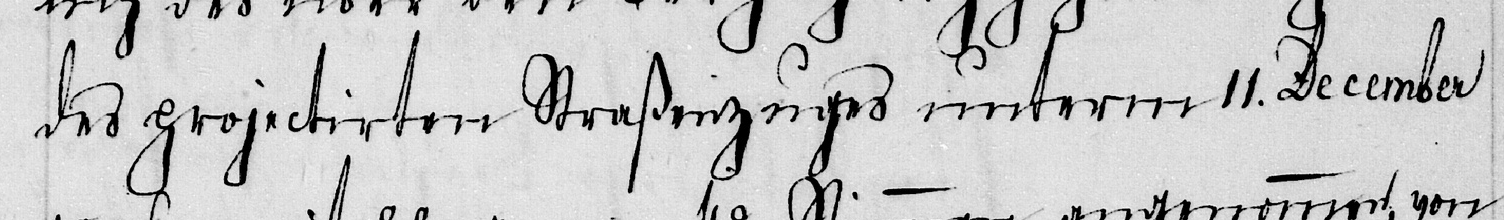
des projectirten Straßenzuges unterm 11. December
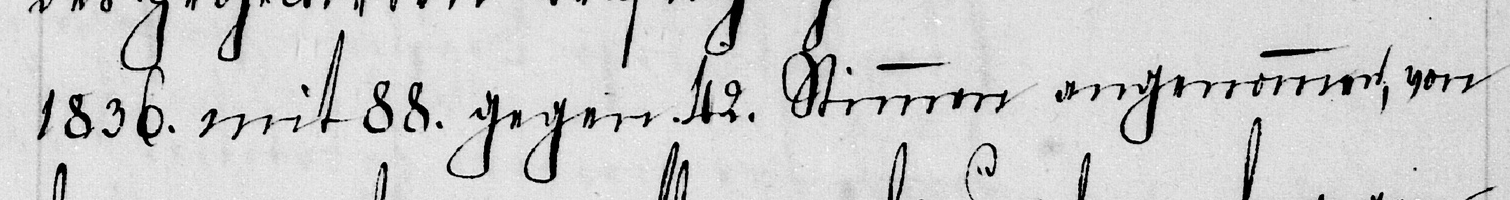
1836. mit 88. gegen 42. Stimmen angenommen, von
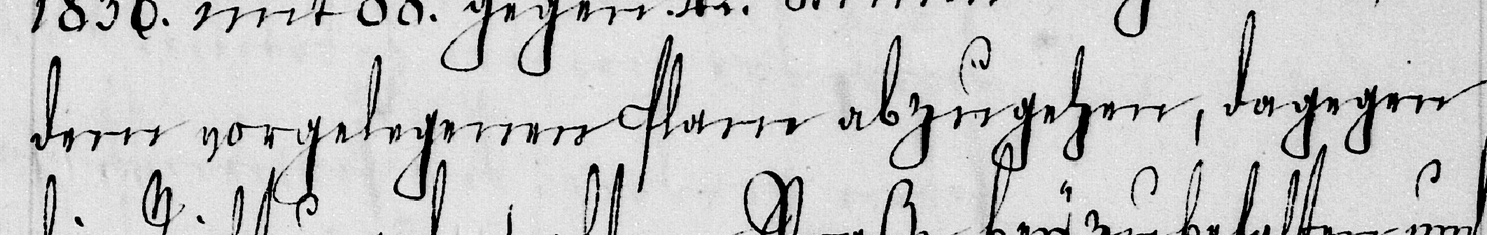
dem vorgelegenen Plan abzugehen, dagegen
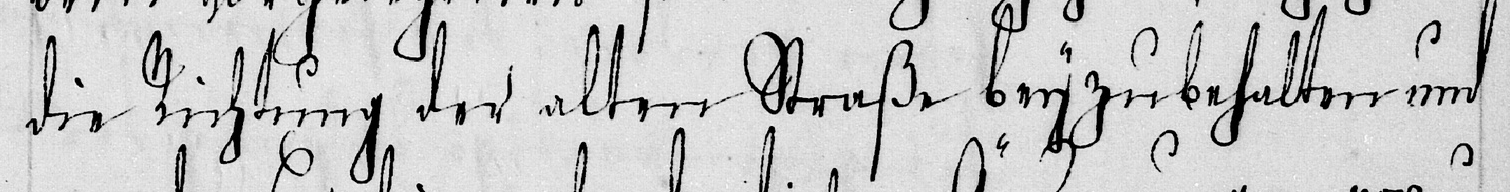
die Richtung der alten Straße beyzubehalten und
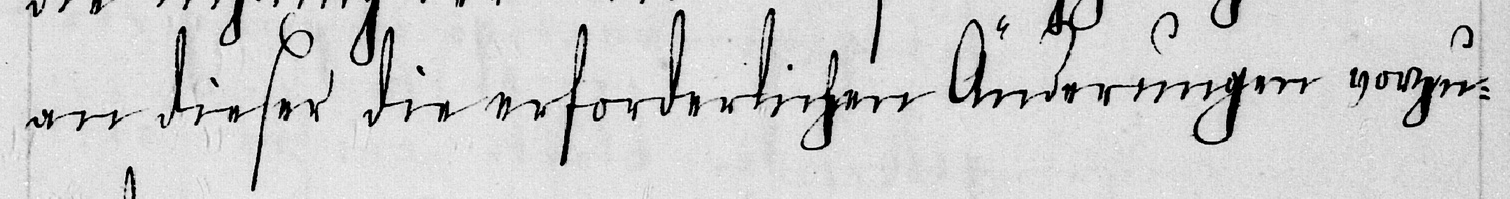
an dieser die erforderlichen Änderungen vorzu¬
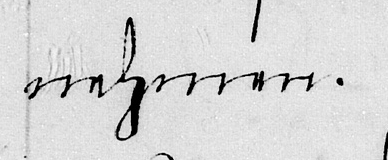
nehmen.
